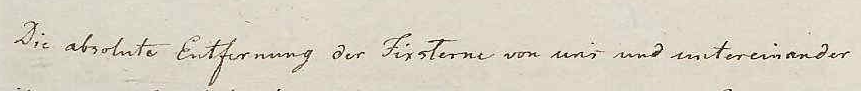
Die absolute Entfernung der Fixsterne von uns und untereinander
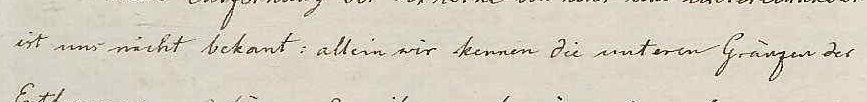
ist uns nicht bekant: allein wir kennen die unteren Gränzen der
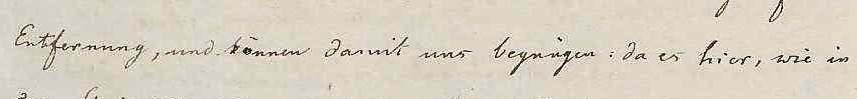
Entfernung, und können damit uns begnügen: da es hier, wie in
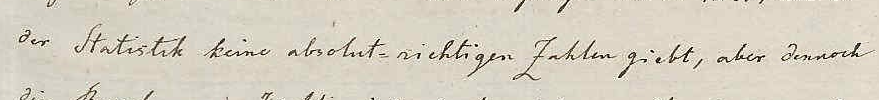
der Statistik keine absolut-richtigen Zahlen giebt, aber dennoch
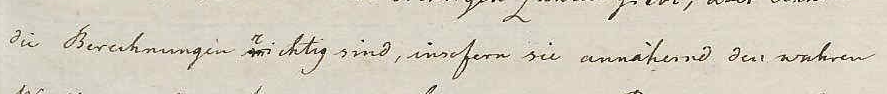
die Berechnungen wrichtig sind, insofern sie annähernd den wahren
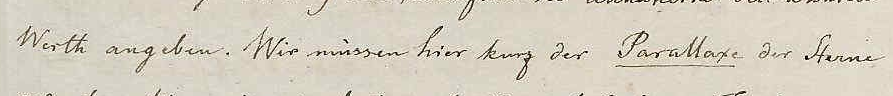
Werth angeben. Wir müssen hier kurz der Parallaxe der Sterne
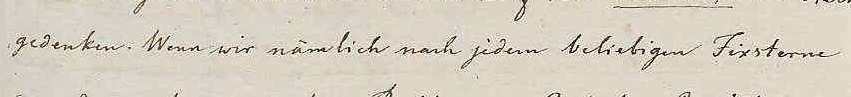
gedenken. Wenn wir nämlich nach jedem beliebigen Fixsterne
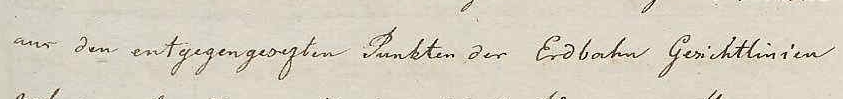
aus den entgegengesezten Punkten der Erdbahn Gesichtlinien
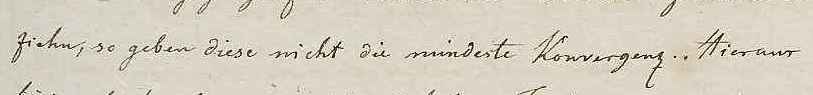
ziehn, so geben diese nicht die mindeste Konvergenz. Hieraus
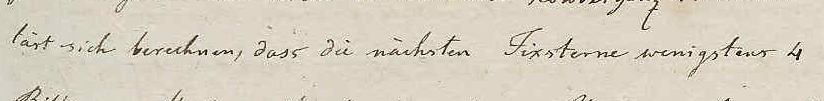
läst sich berechnen, dass die nächsten Fixsterne wenigstens 4
